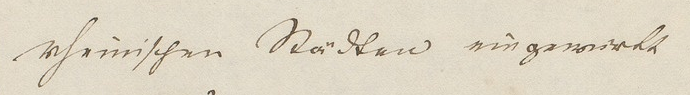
rheinischen Städten eingewirkt
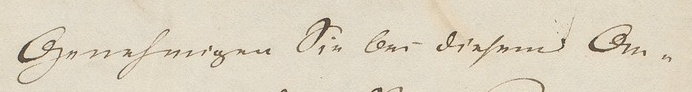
Genehmigen Sie bei diesem An-
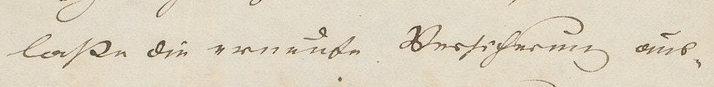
laße die erneute Versicherung aus-
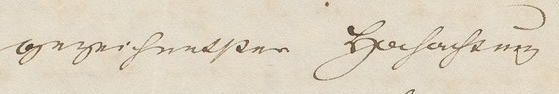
gezeichnetster Hochachtung
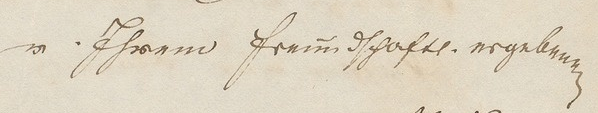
v. Ihrem freunschaftl. ergebenen
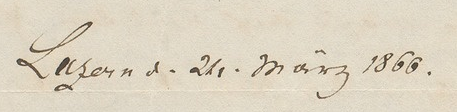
Luzern d. 24. März 1866.
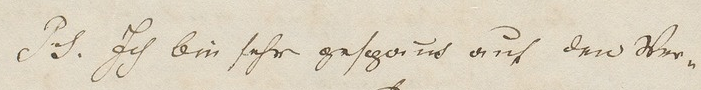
PS. Ich bin sehr gespannt auf den Ver-
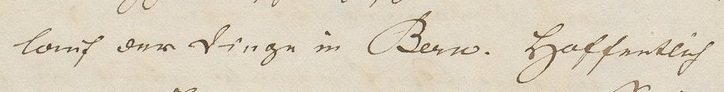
lauf der Dinge in Bern. Hoffentlich
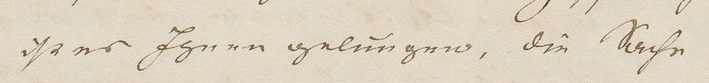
ist es Ihnen gelungen, die Sache
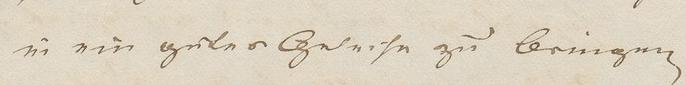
in ein gutes Geleise zu bringen.
